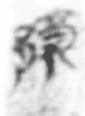鄭
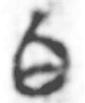白
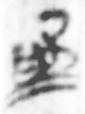爲
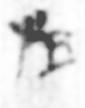○（左）
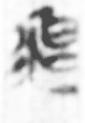飛（騑）
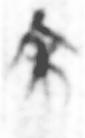宋
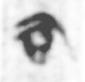司
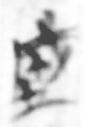城
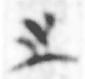之
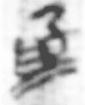爲
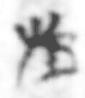○（左）
